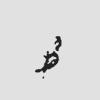矛
